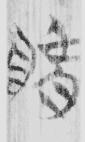{爿兔}
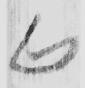㠯（以）
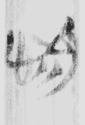惕
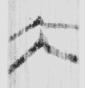大
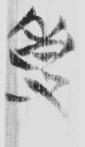事
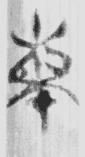柬
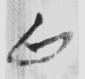㠯（以）
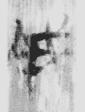成
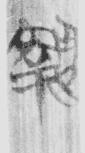執
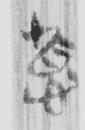惪
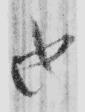女
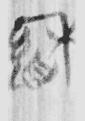縣
